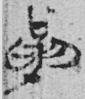革
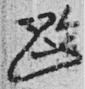攺
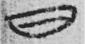日
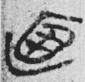廼
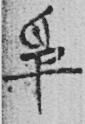孚
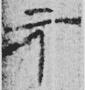元
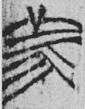羕（永）
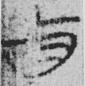貞
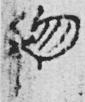利
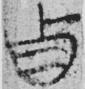貞
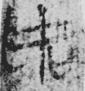呣
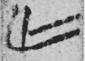亡（无）
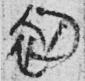初
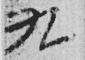九
